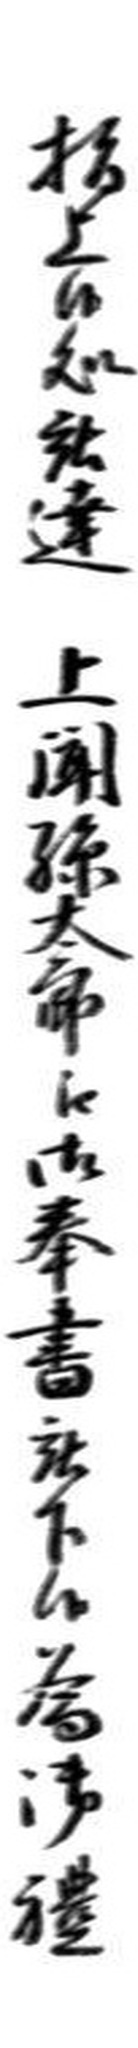指上候処被達上聞孫太郎江御奉書被下候為御礼
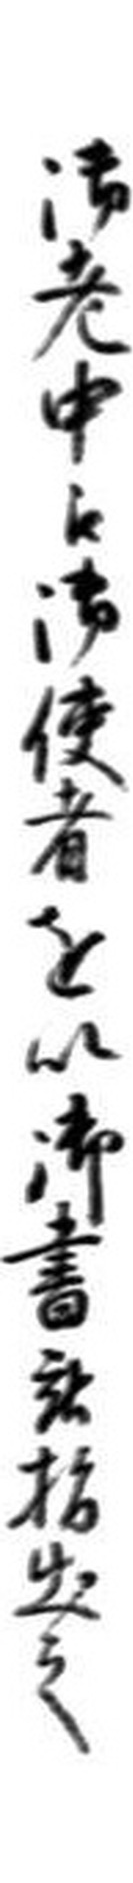御老中江御使者を以御書被指出之
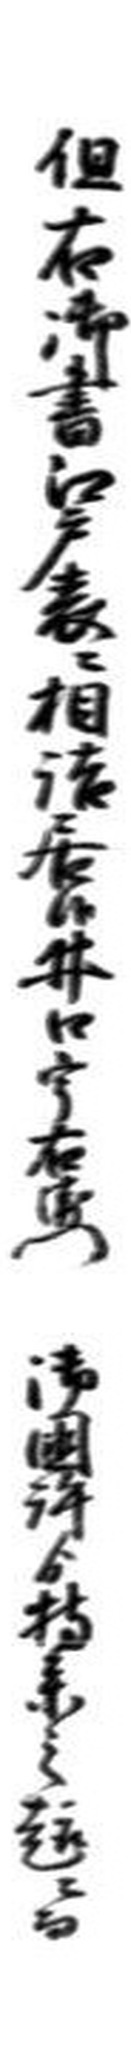但右御書江戸表ニ相詰居候井口宇右衛門御国許ゟ持参之趣ニ而
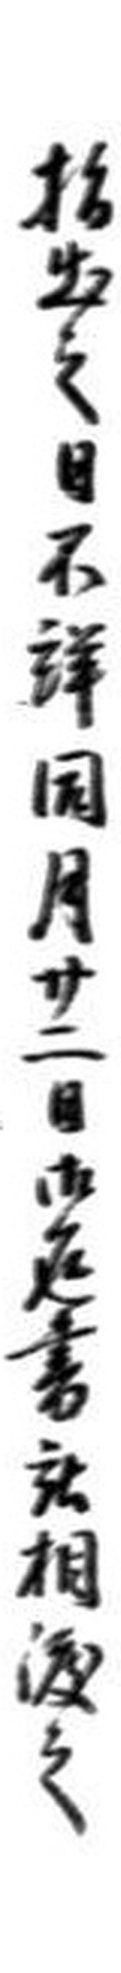指出之日不詳同月廿二日御返書被相渡之
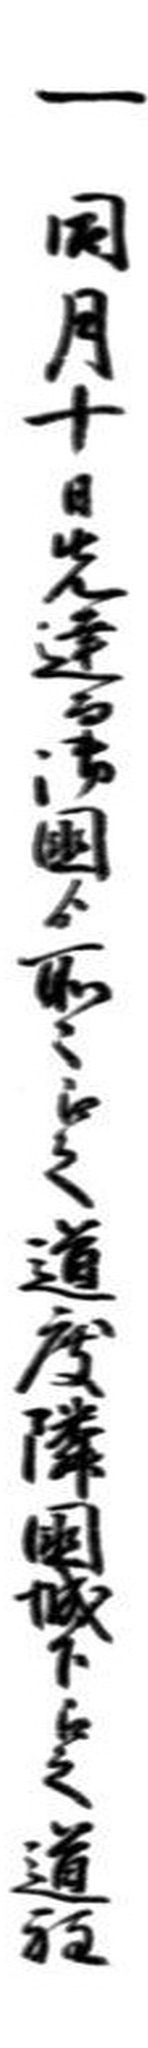一同月十日先達而御国ゟ所々江之道度隣国城下江之道程

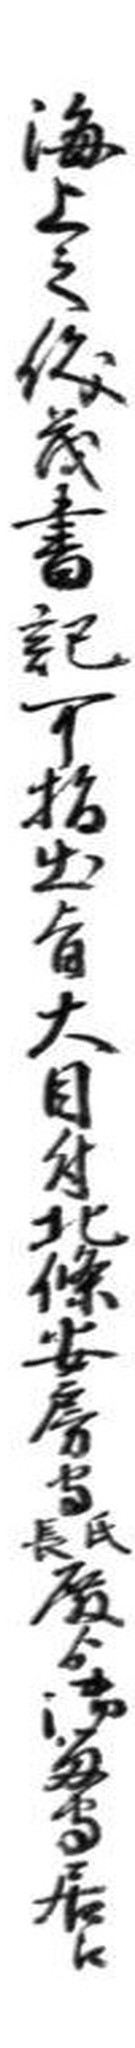海上之儀も書記可指出旨大目付北條安房守氏長殿ゟ御留守居江
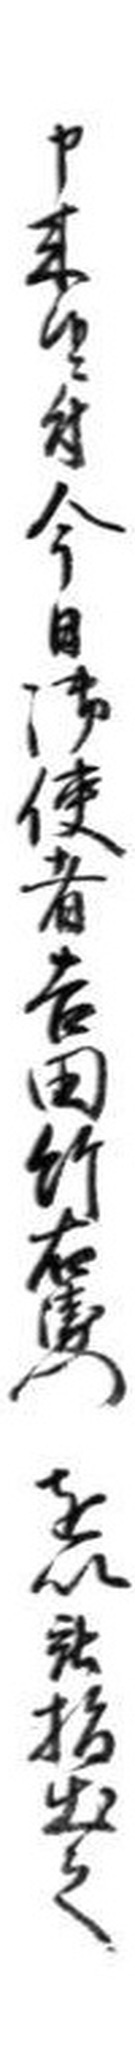申来候ニ付今日御使者吉田竹右衛門を以被指出之
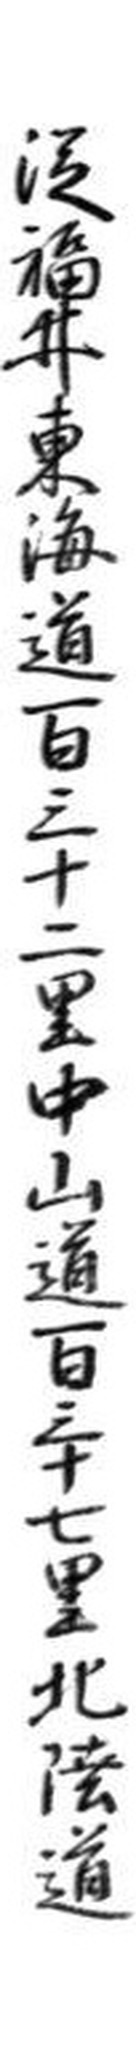従福井東海道百三十二里中山道百三十七里北陸道
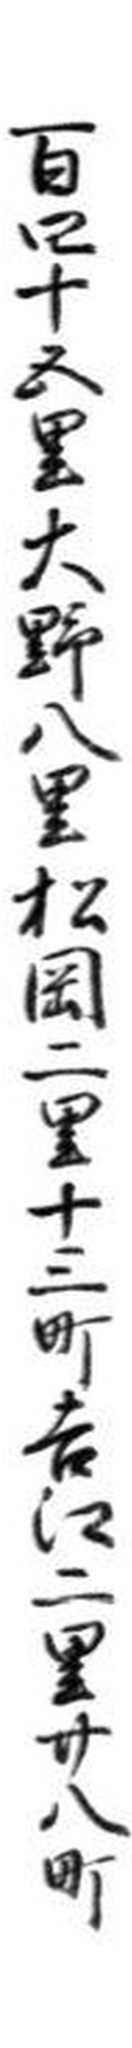百四十五里大野八里松岡二里十三町吉江二里廿八町
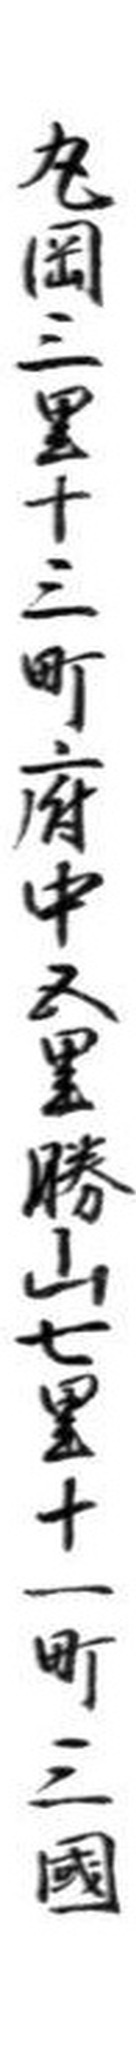丸岡三里十三町府中五里勝山七里十一町三国
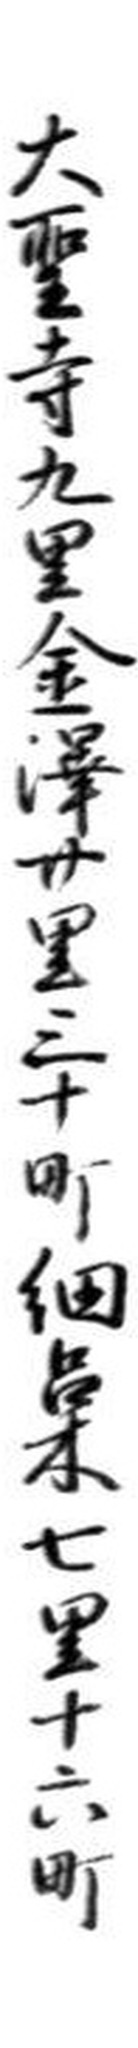大聖寺九里金沢廿里三十町細呂木七里十六町
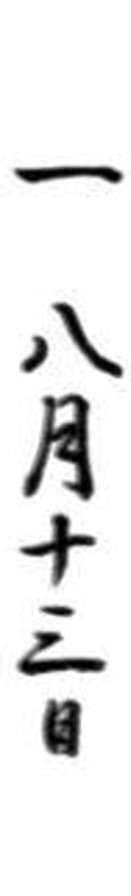一八月十三日
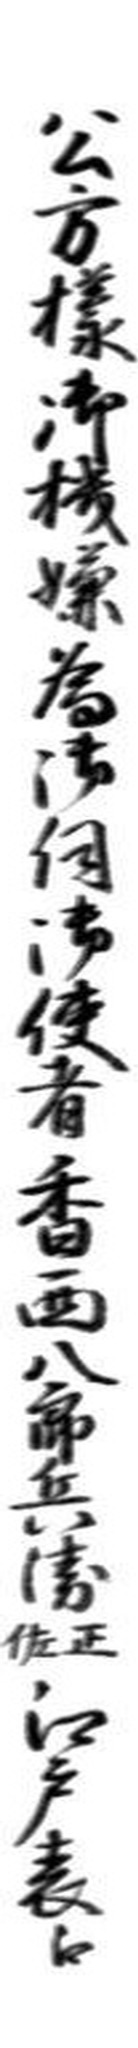公方様御機嫌為御伺御使者香西八郎兵衛正佐江戸表ゟ
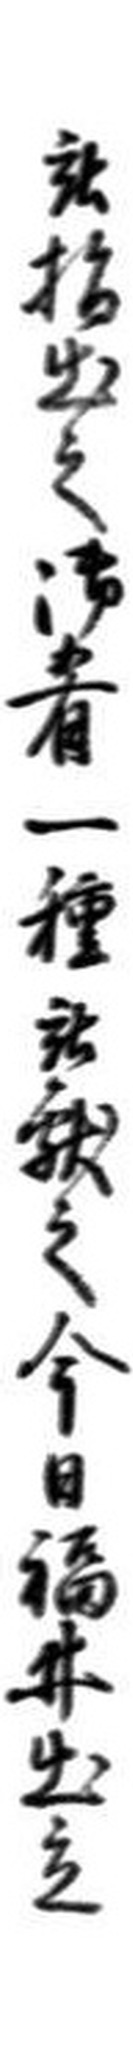被指出之御肴一種被献之今日福井出立
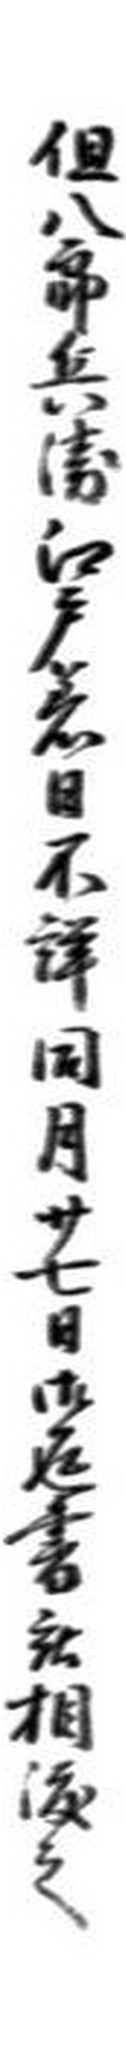但八郎兵衛江戸着日不詳同月廿七日御返書被相渡之
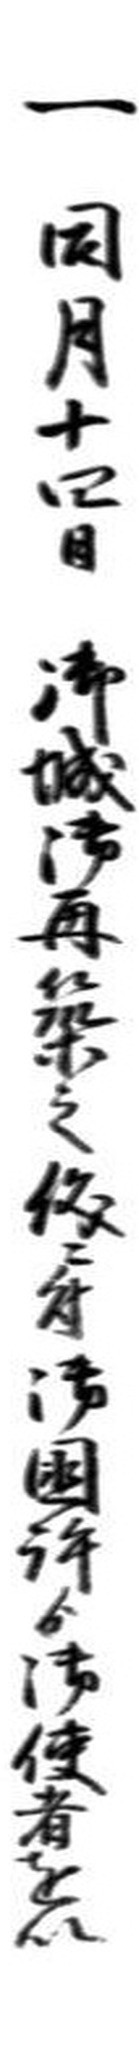一同月十四日御城御再築之儀ニ付御国許ゟ御使者を以
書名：家譜 七 光通公 従寛文四年到同九年
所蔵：福井県文書館 Fukui Prefectural Archives
